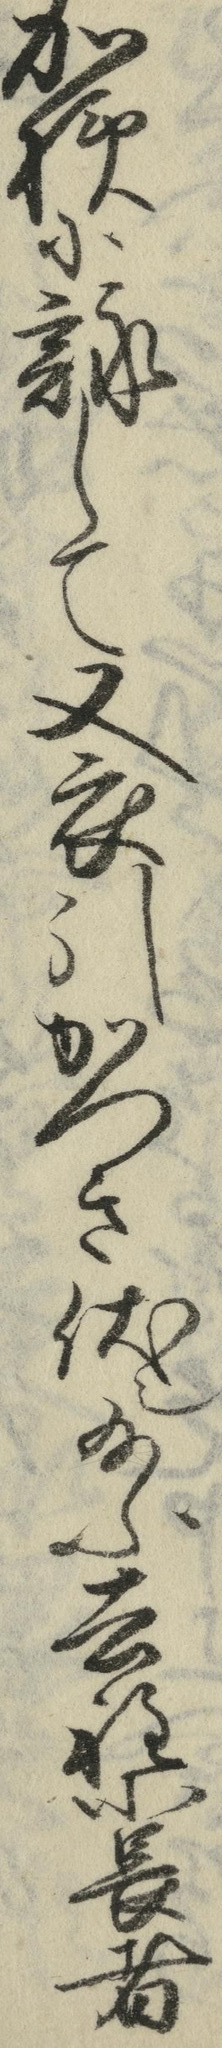か様に詠して又衣引かつき伏給ふ去程に長者
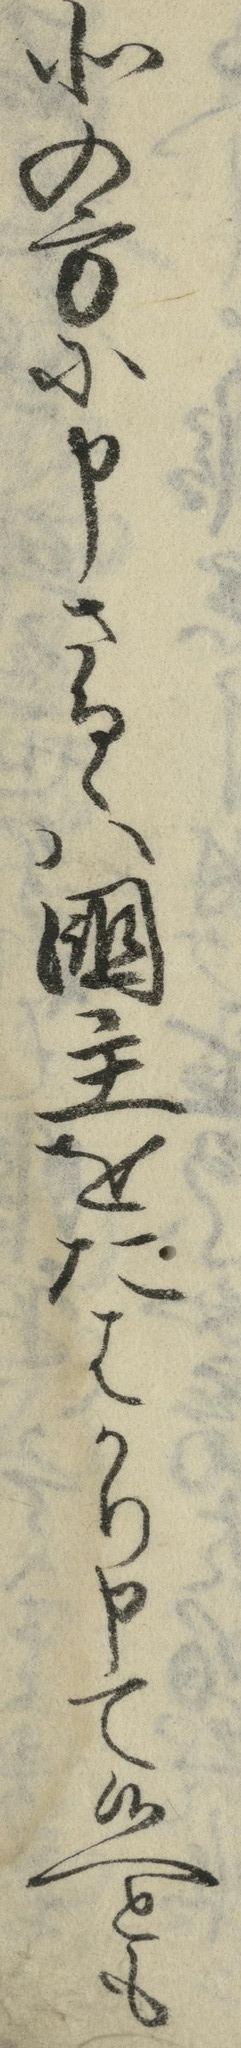北の方に申さるゝは国主をたはかり申て候へとも

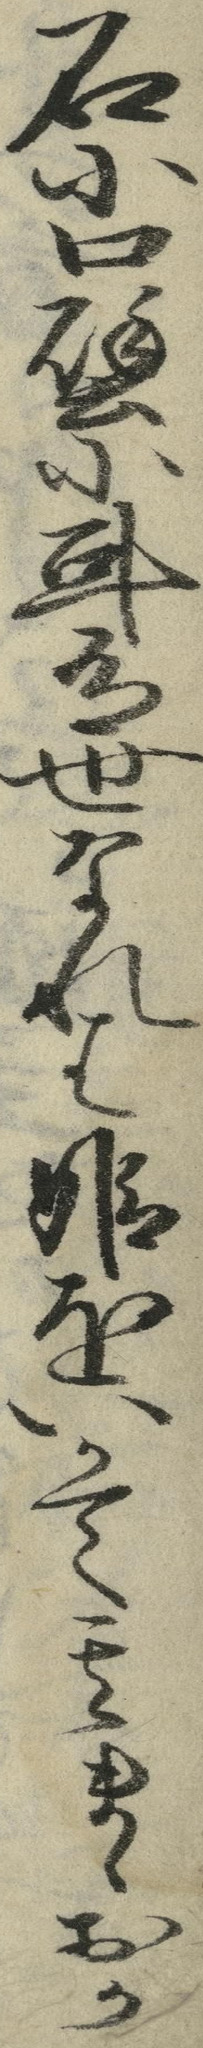石に口壁に耳有世なれは姫をいかて其まゝおか
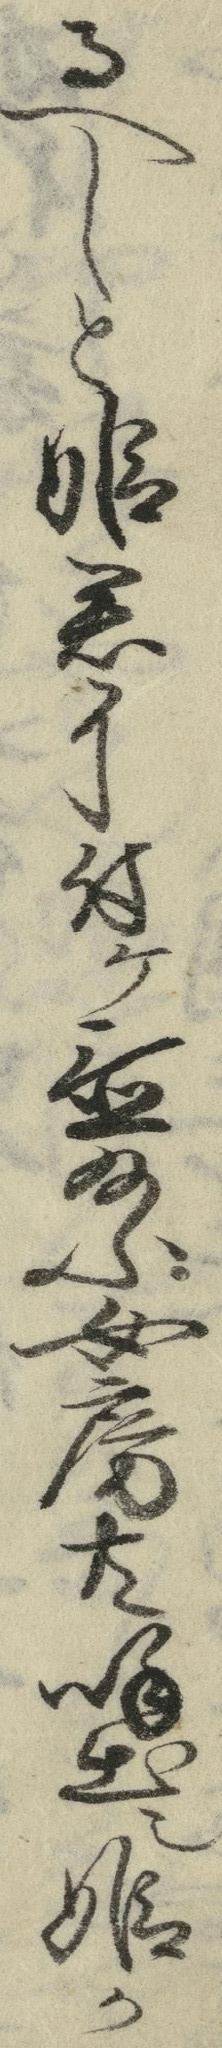るへしと姫君に付ケ置給ふ女房共呼出シ姫か
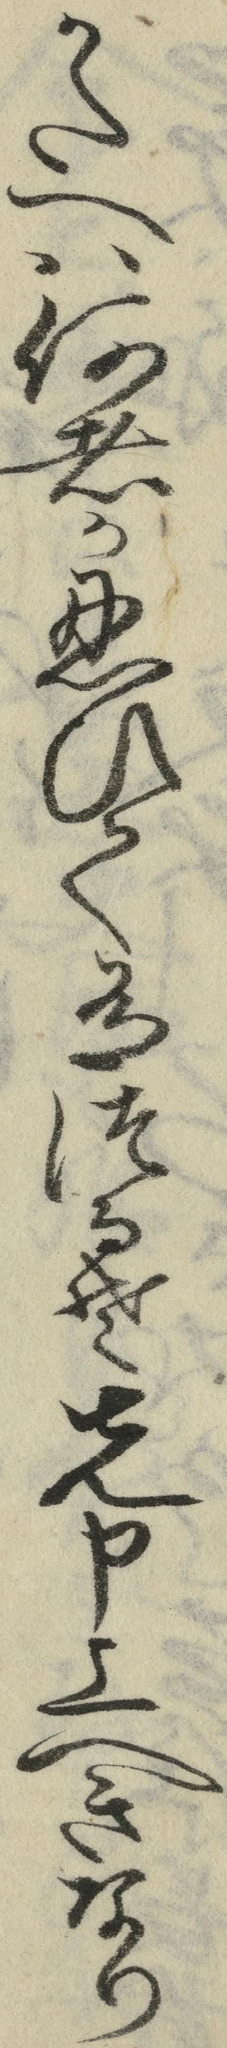かたへハ何者か忍ひて有つるそ先申上へきなり
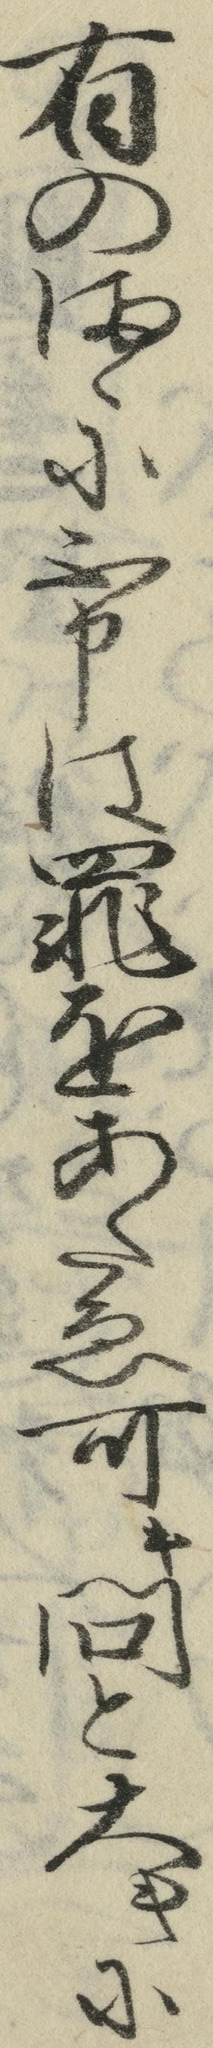有のまゝに不申は罪をあたゑ可キ問と大キに
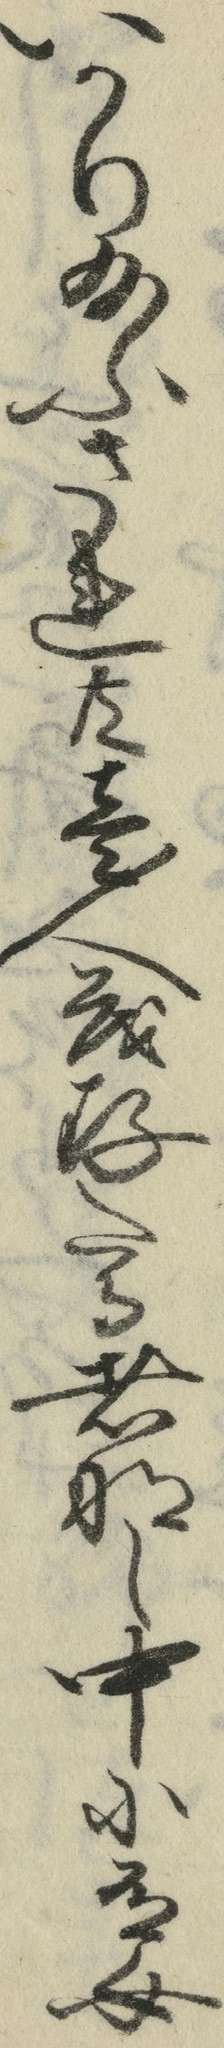いかり給ふされ共壱人も存たる者なし中に有女
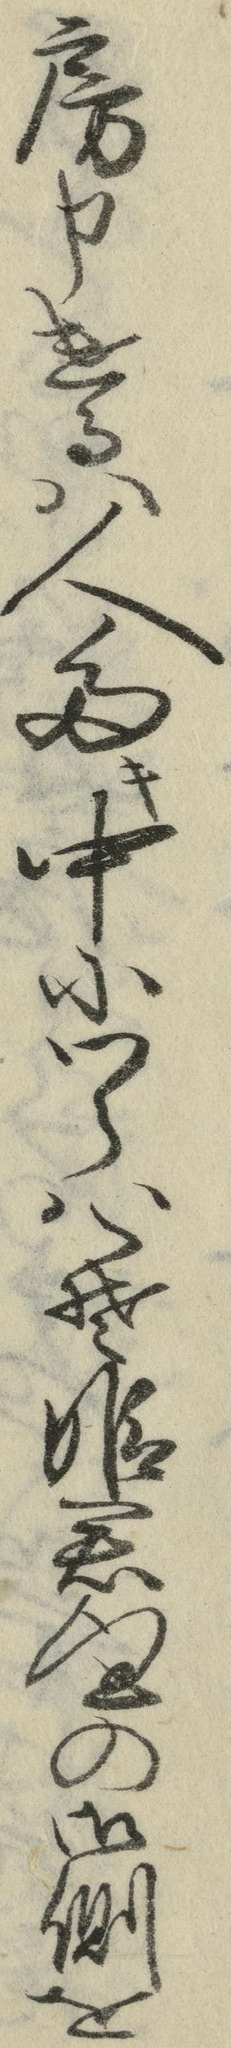房申けるハ人多キ中にワらハこそ姫君様の御側を
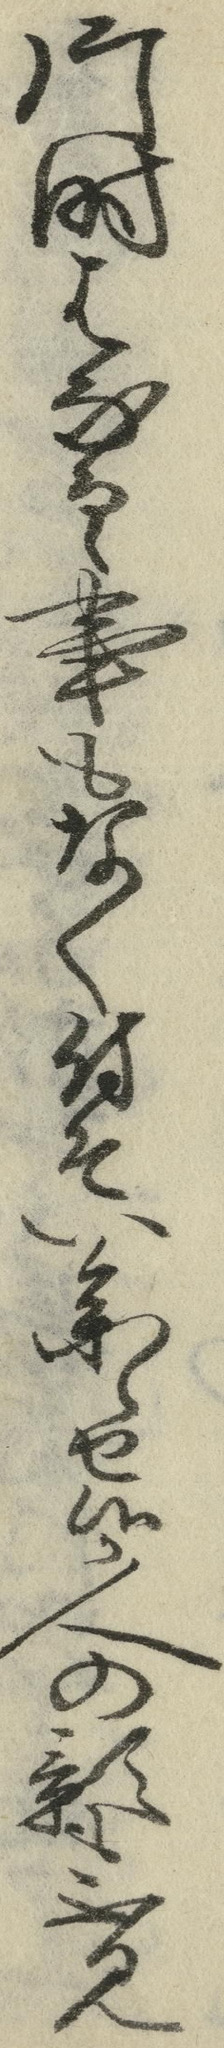片時はなるゝ事もなく付そい参らせ候か人の影も不見
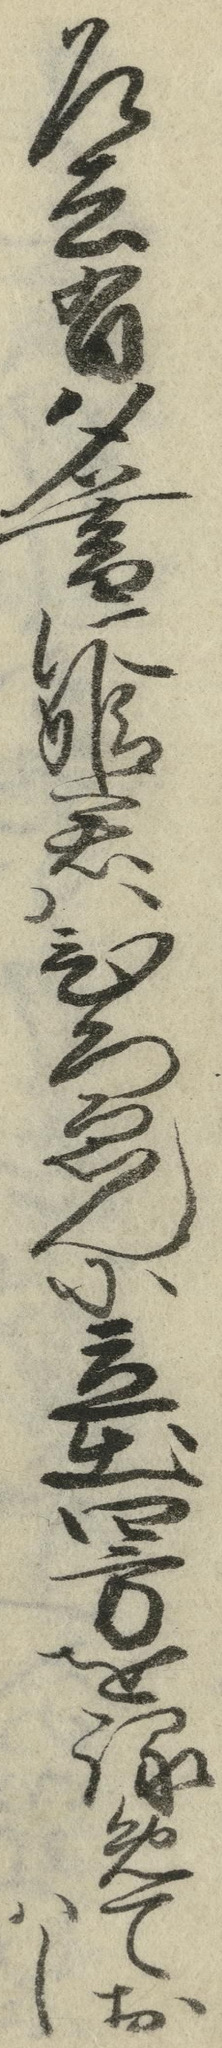乍去有夕暮に姫君ハひろゑんに立出四方を詠めておハし
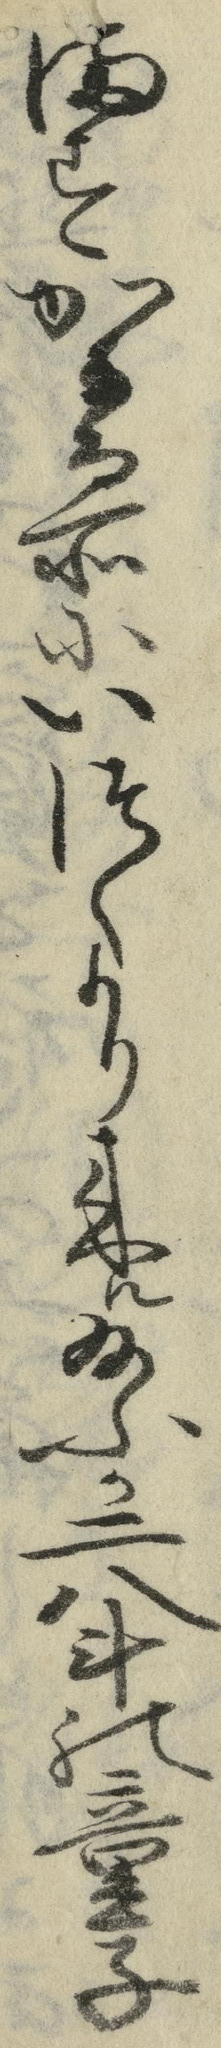ますかゝる所にいつくより来ル給ふか二八斗の童子
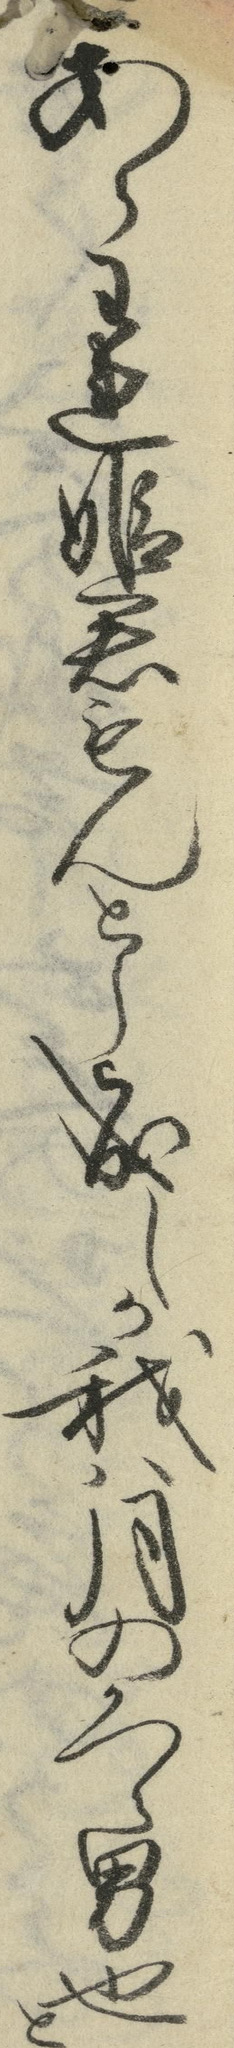あらわれ姫君もんとう被成しか我は月のかつら男也と
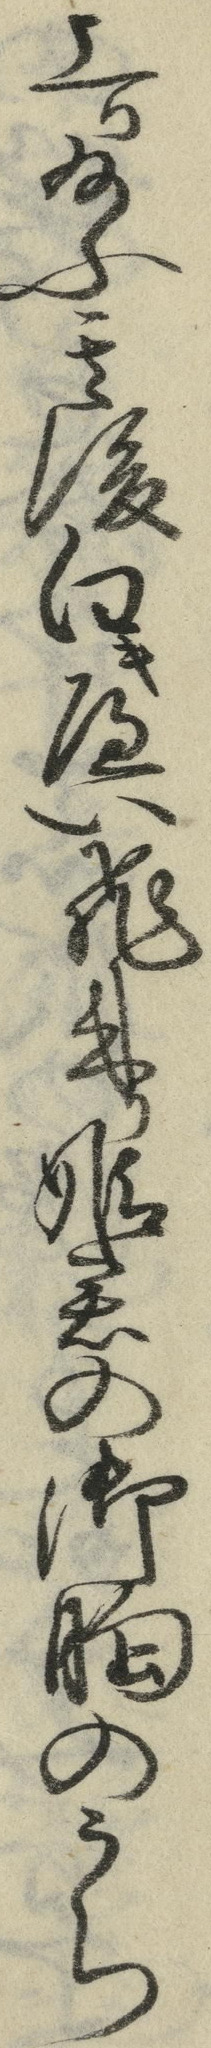上リ給ふ其後白キへい飛来リ姫君の御胸のうち
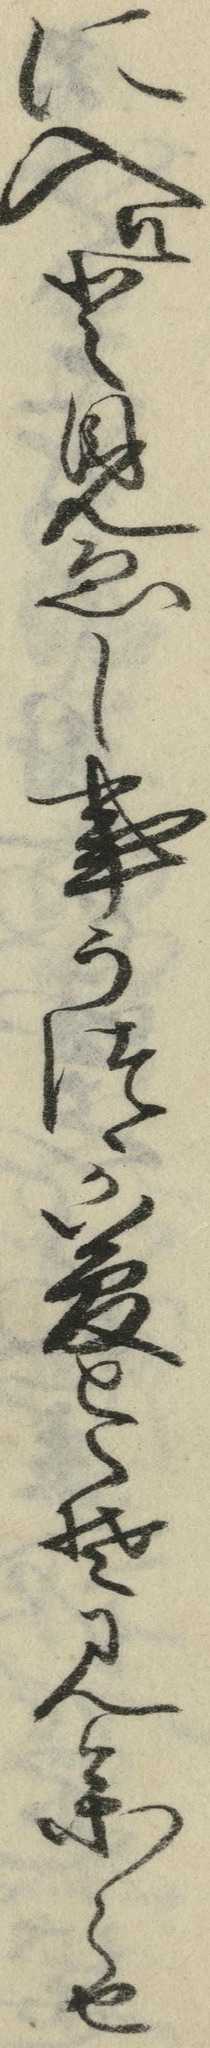に入ルと見ゑし事うつゝか夢とこそ見参らせ
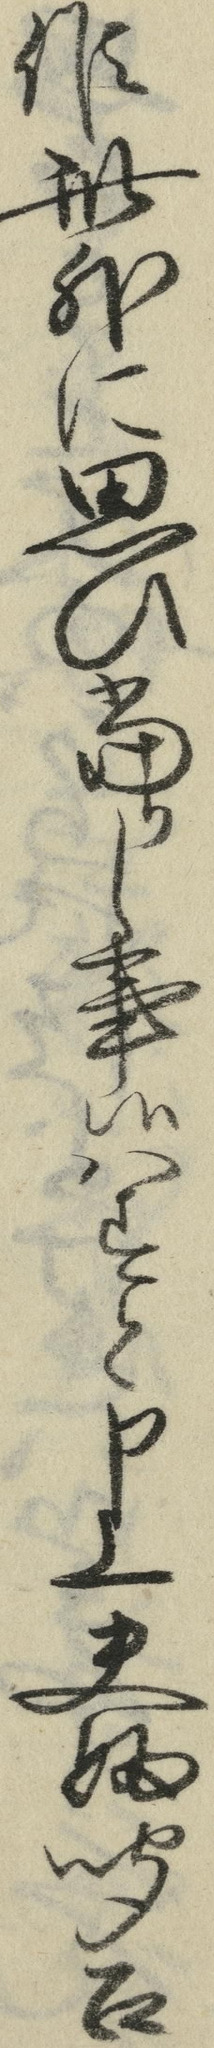候此外に思ひ当リし事候ハすと申上夫婦聞召
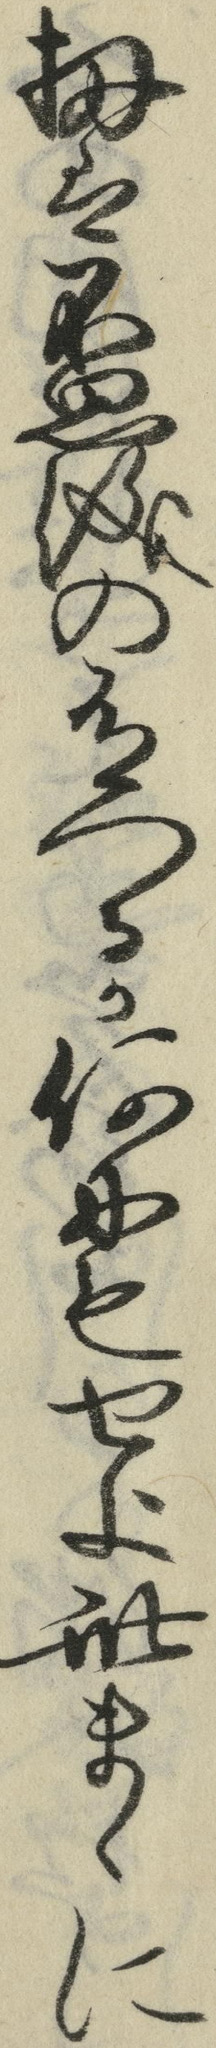扨は不思議の有つるか何にもせよ此まゝに
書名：浅間記
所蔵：東京大学地震研究所図書室 Earthquake Research Institute Library, The University of Tokyo, JAPAN
